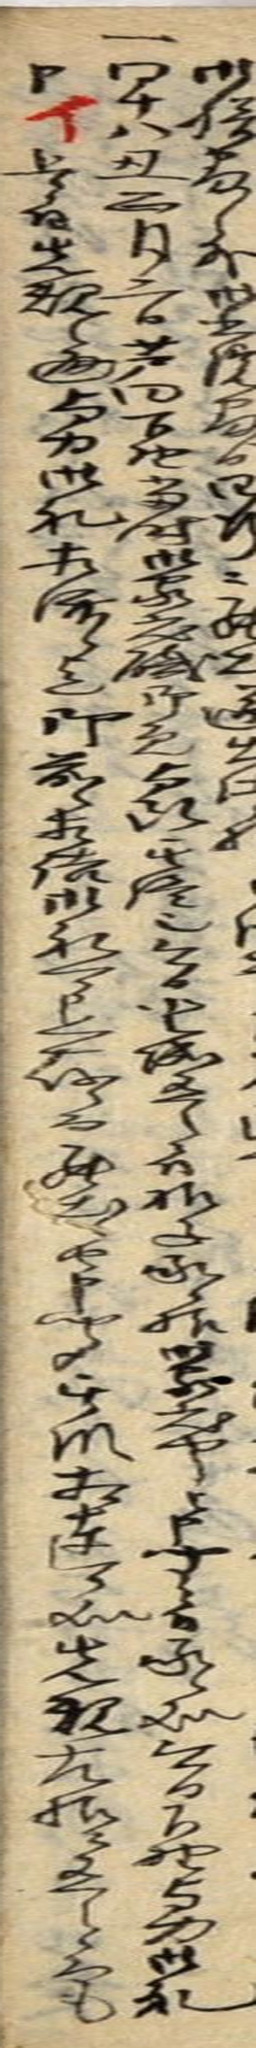申上候付先規之通与力御礼相済候迄御前へ相詰御礼可申上存候而罷出候由申聞其段相達候処先規左様に有之候而も

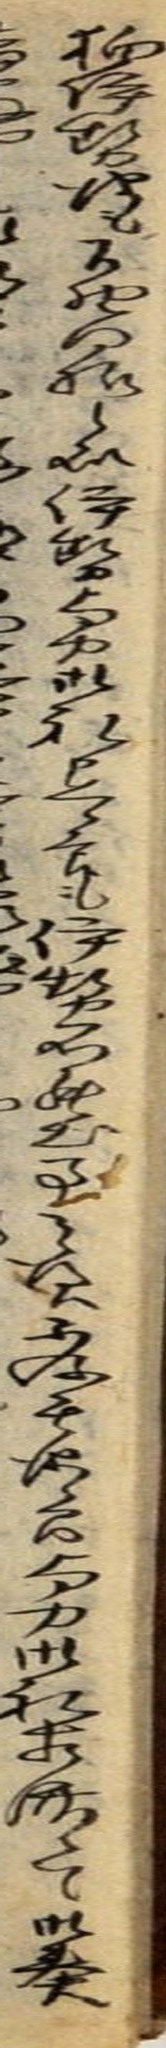狛伊勢儀も下野同様之処伊勢与力御礼申上候節も伊勢不罷出事に候へは不及其儀候間与力御礼相済候はゝ御奏
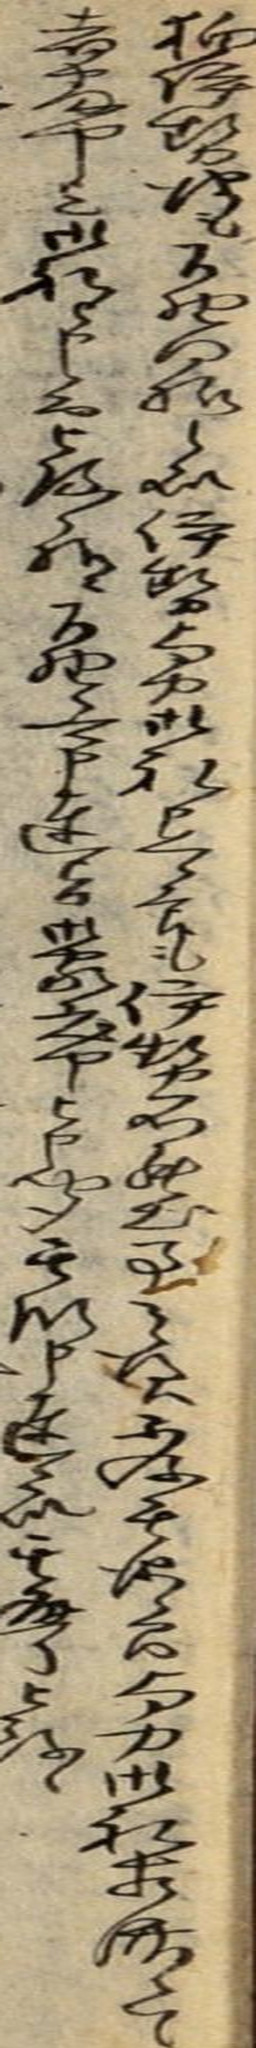者番中迄御礼被申候而被帰候様に下野へ可申達候旨御家老中被申聞其段申達候処其通り被致候
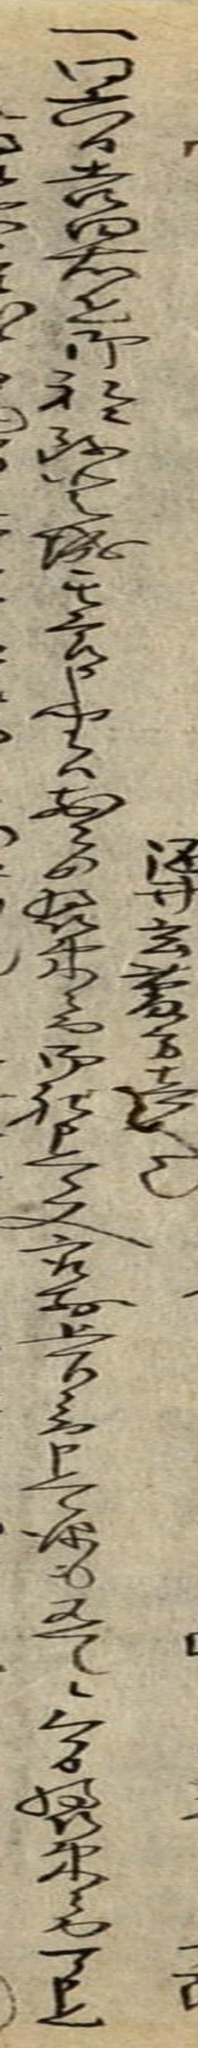一同六日吉田右近御礼に致登城其節申聞候は前々ゟ装束に而御礼申上候又最前上下に而申上候儀も有之候今日装束に而可申上
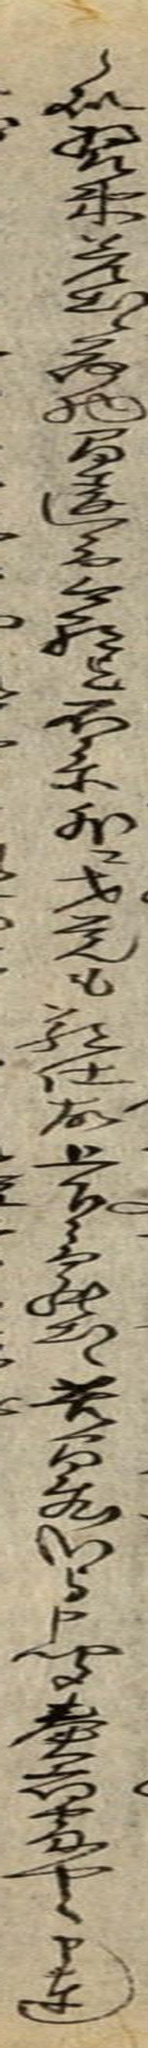候処装束差出候荷物間違に而今朝迄不参外に才覚も難仕故上下に而罷出候苦間敷哉と申聞奏者番中へ申達
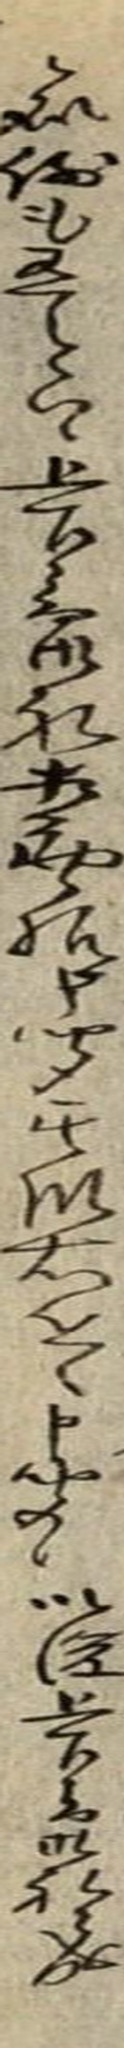候処例も有之候はゝ上下に而御礼相勤候様申聞其段右近へ申聞候以後上下に而御礼被成
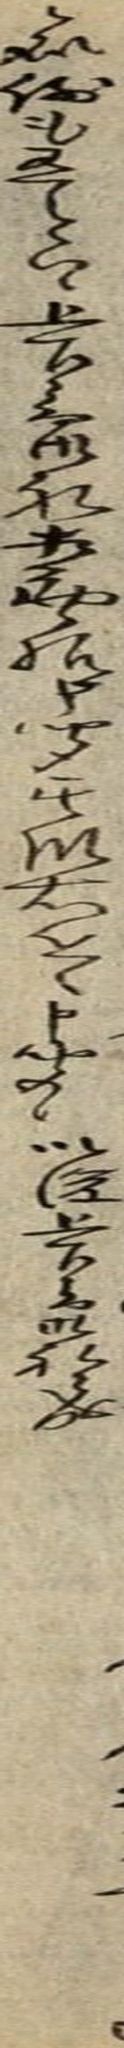候処例も有之候はゝ上下に而御礼相勤候様申聞其段右近へ申聞候以後上下に而御礼被成
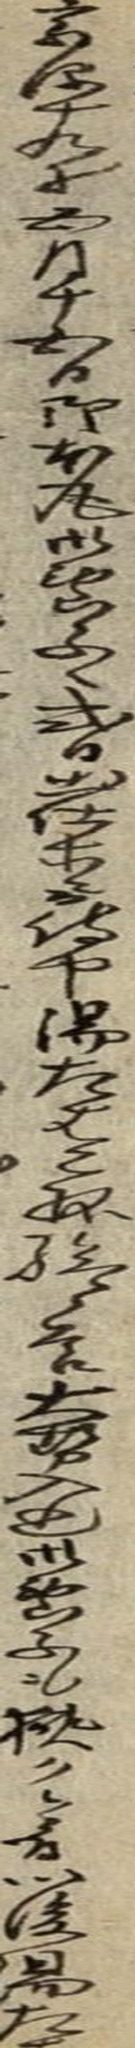一享保十九寅五月十五日御本丸御台子へ式日出仕等に而侍中湯たはこ抔給候節大勢入込御台子も狭く候に付以後湯たば
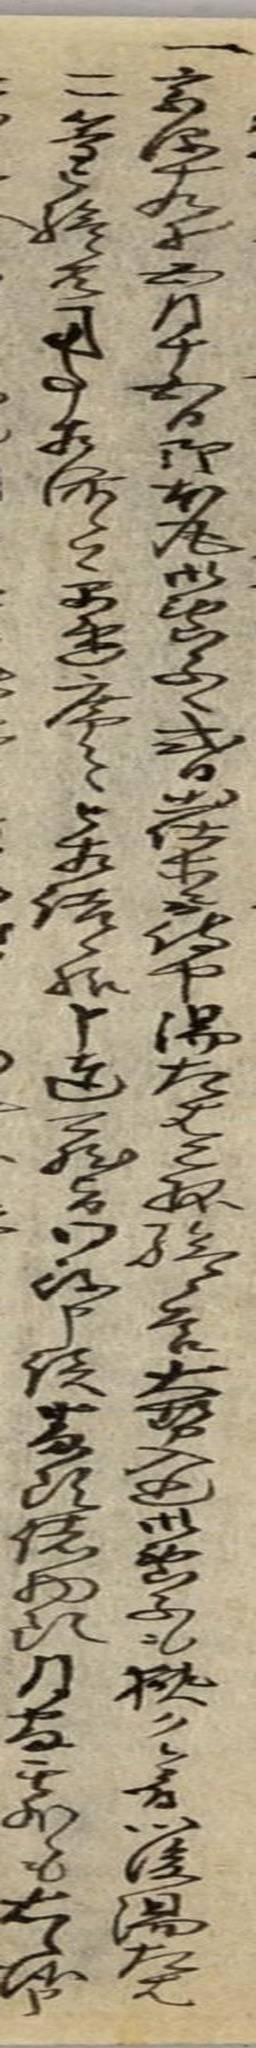こ等給候共用事相済候はゝ早速席々へ被相詰候様申達可然旨同役申談番頭諸物頭月番其外へも右之趣申
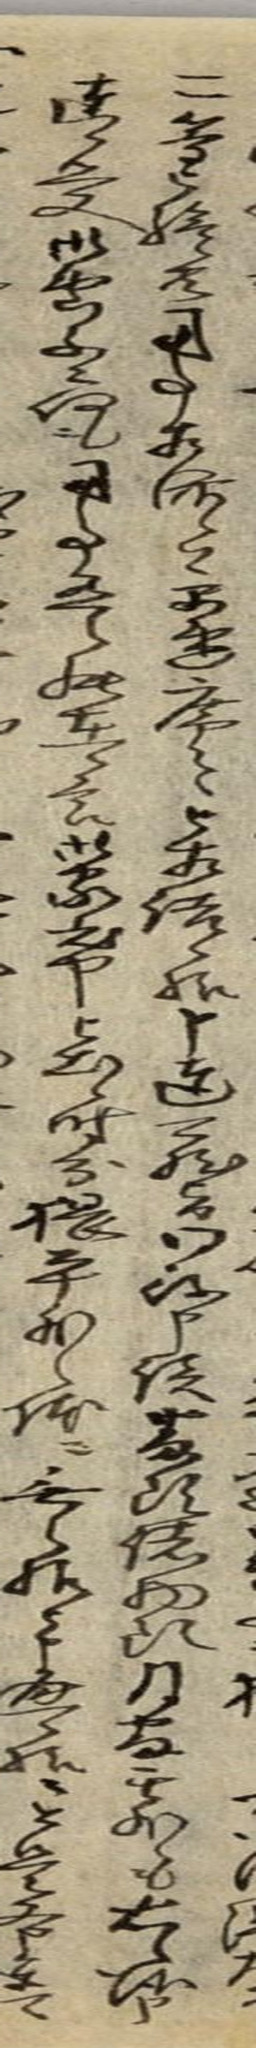達候且又御台子に何も用事有之罷在候節御家老中被出候時分猥平外之体に無之様被申通候様にと是又申達候
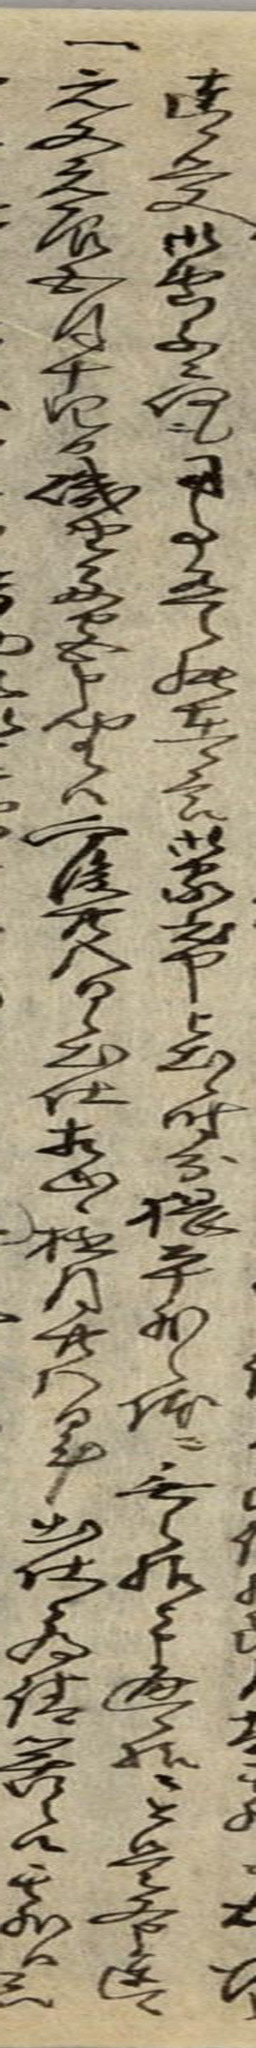一元文元辰五月十四日磯野多宮申聞候は向後廿八日之出仕相止候極月廿八日斗出仕被為請候筈に候其外は只
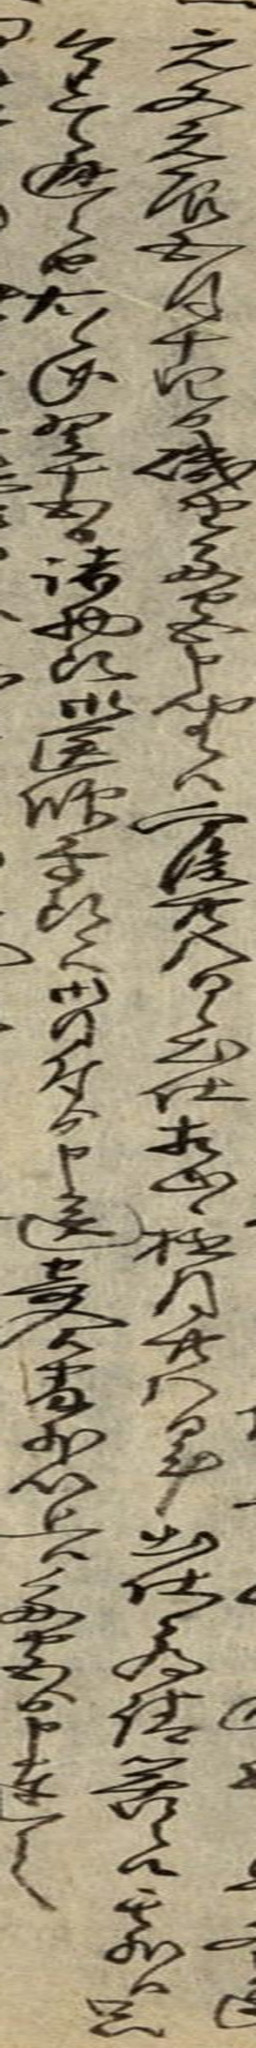今迄之通之由右之趣翌十五日諸物頭御医師筆頭へは御目付ゟ申送寄合番外以上は多宮ゟ申達之
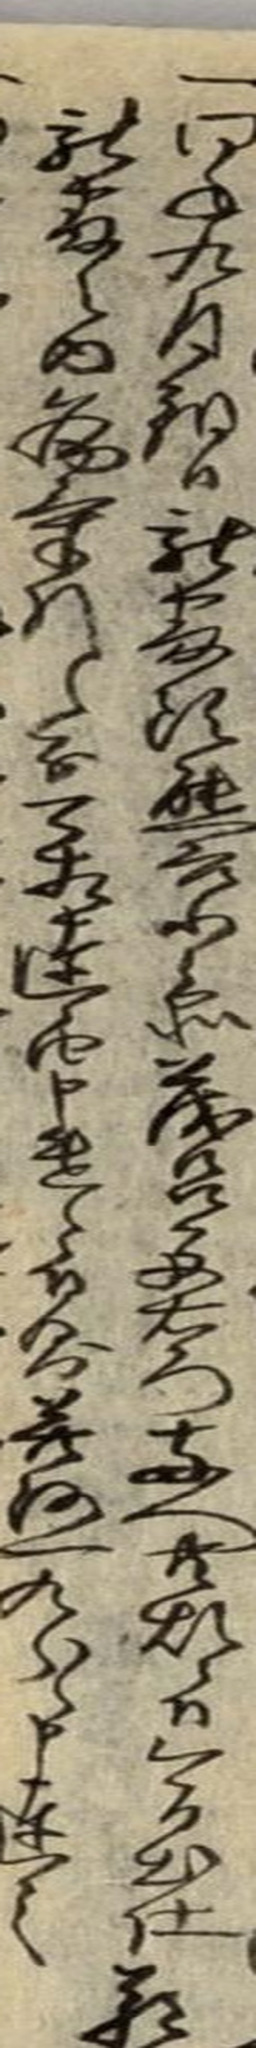新番之内病気引之分可相達由に申遣候に付則並河一九郎へ申達之
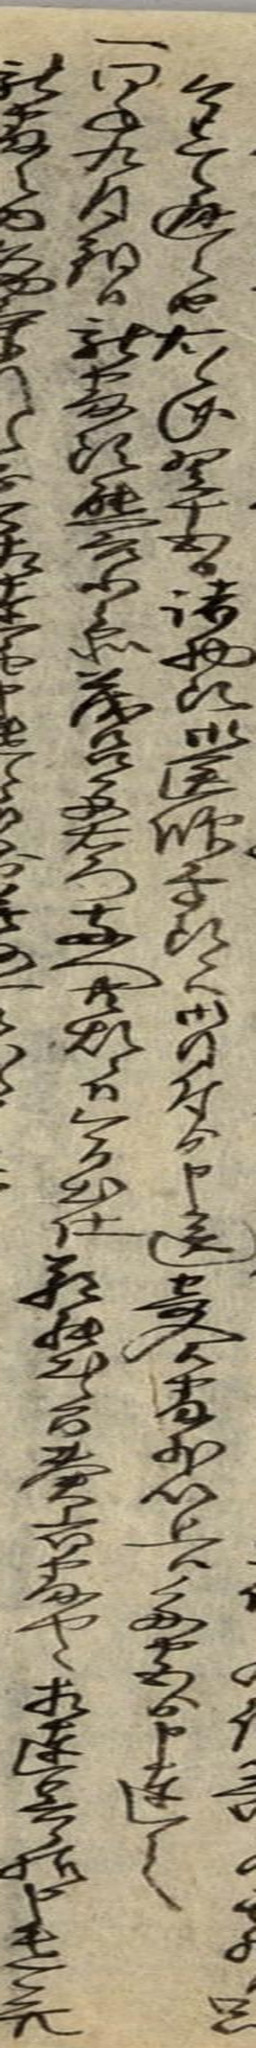一同年九月朔日新番頭熊谷小兵衛茂呂多右衛門両人共煩候に付今日出仕難罷出候間奏者番中へ相達呉候様申遣候へ共
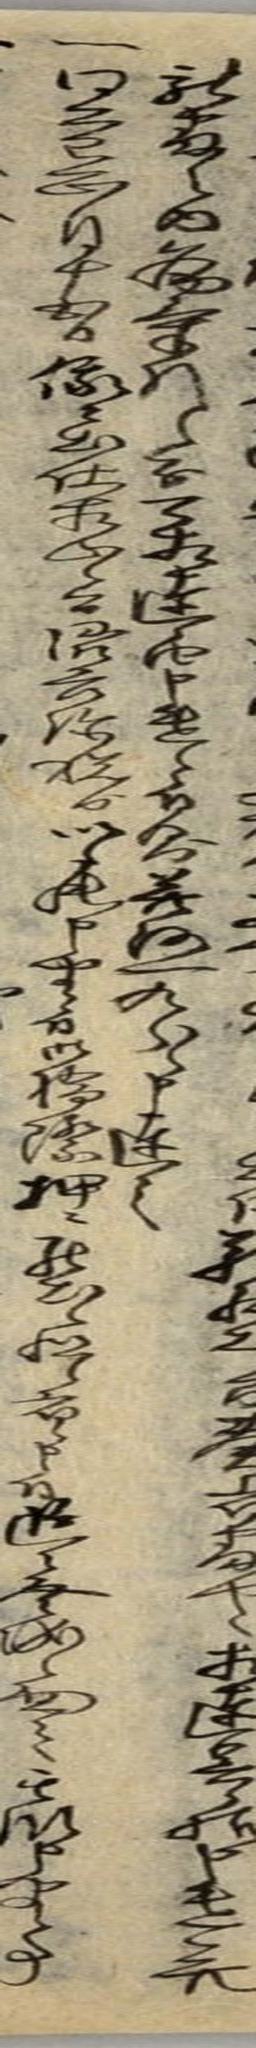一同二巳正月十五日俄に出仕相止候旨渋谷弥税ゟ以手紙申聞候に付御橋際押に罷出候組之者へ申付追々登城之面々へ其段申聞候事
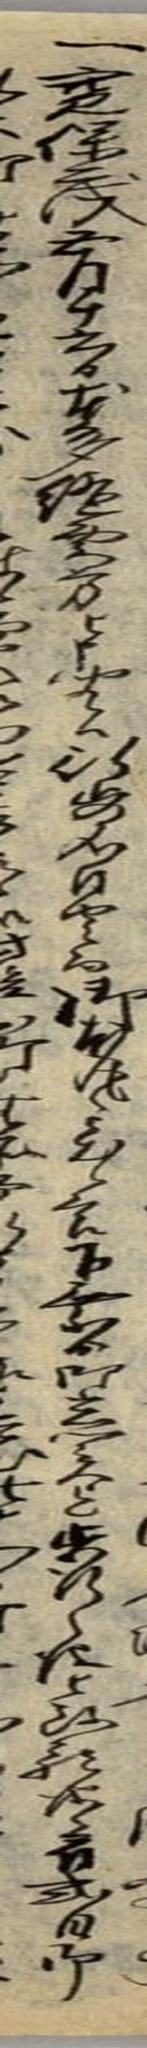一寛保二戌五月十六日本多縫殿方被申聞候は歩行不自由に而御本丸へ被出候節下乗ゟ御玄関迄歩行之儀被致難儀に候ニ付式日御
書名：蒐輯之部
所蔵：福井県文書館 Fukui Prefectural Archives
